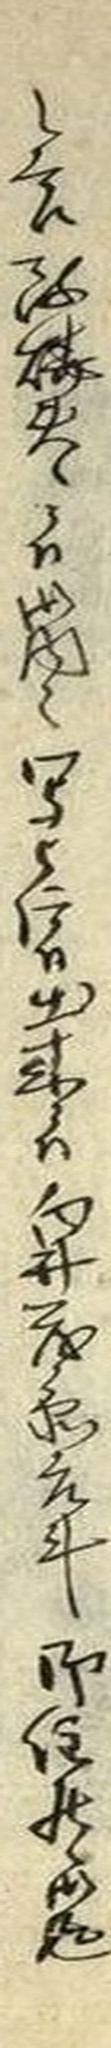之節致焼失候ニ付御内々写被仰付出来ニ付白井茂兵衛取斗御住居へ御廻
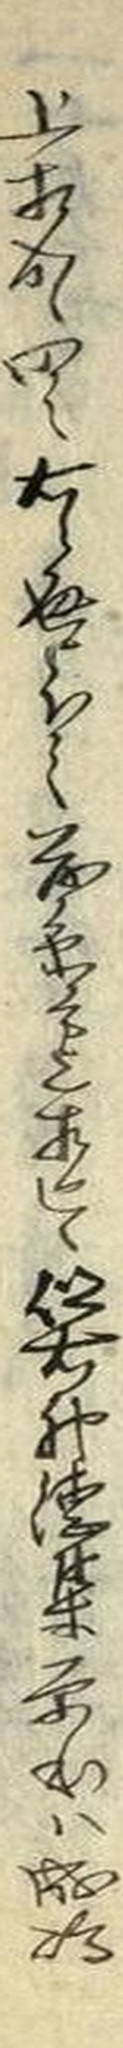上相成候仍之右之通被下之茂兵衛方迄相廻候但右神徳集原本ハ成嶋
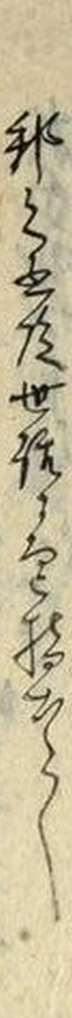邦之丞殿世話ニ而被指出之
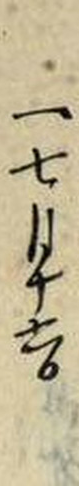一七月十六日

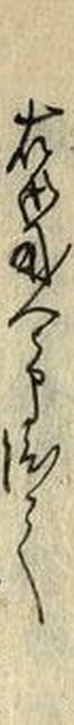右御用人被申渡之
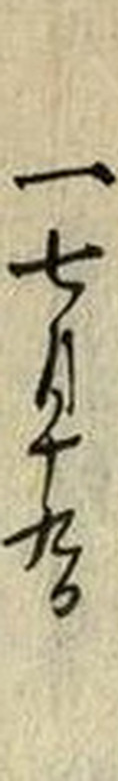一七月十九日
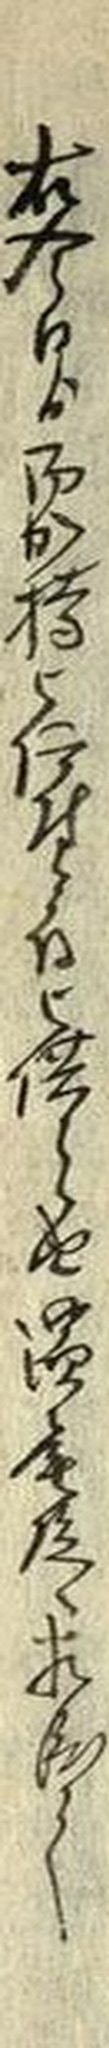右今日ゟ御加持被仰付ニ付被供候由浜尾殿へ相渡之
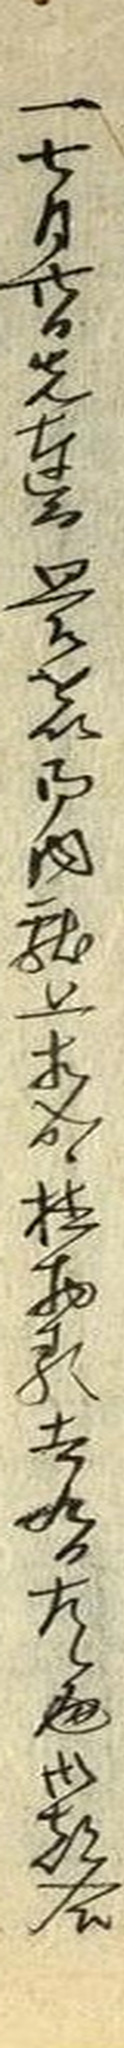一七月廿日先達而思召を以御内献上相成候植物類去九日左之通御都合
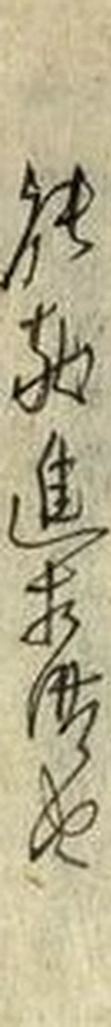能献進相済候由
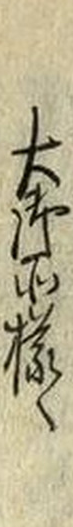大御所様へ
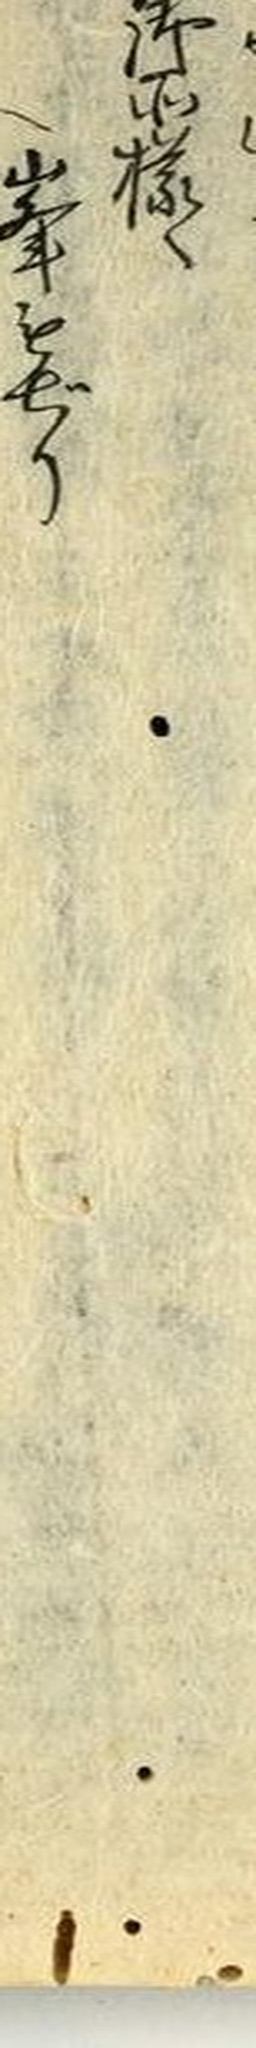峯もぢり
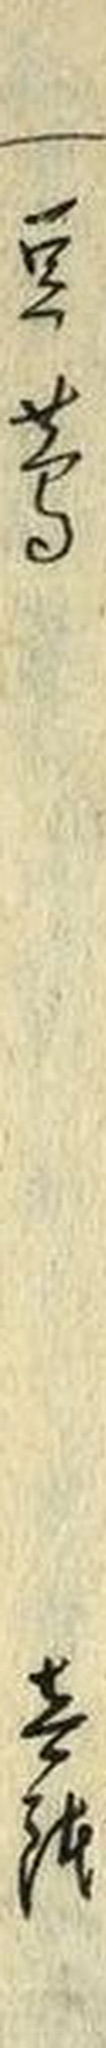豆蔦壱鉢
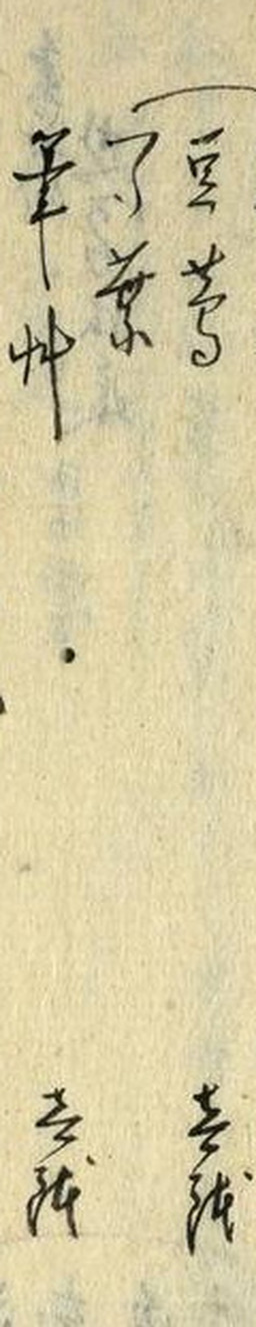一ツ葉
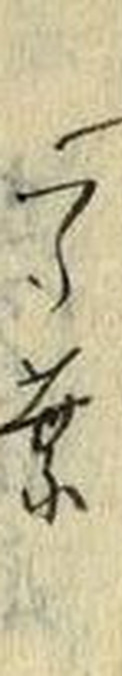一ツ葉
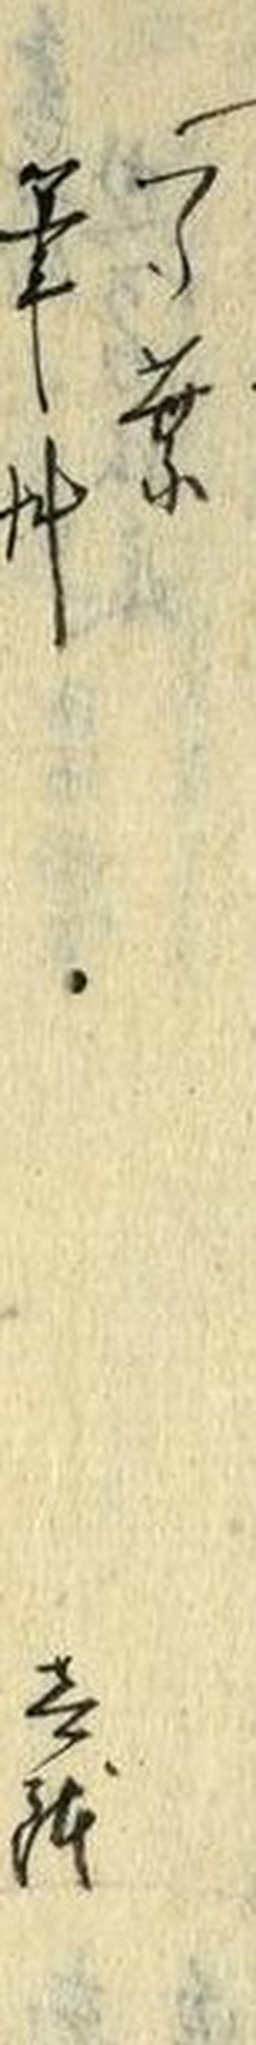筆草壱鉢
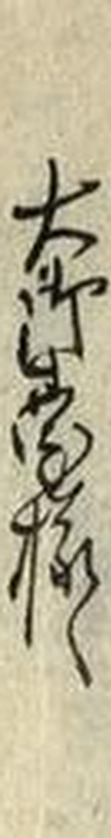大御台様へ
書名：少傅日録抄（斉善付側向頭取日記、江戸并道中、初入在国、逝去後…
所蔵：福井県文書館 Fukui Prefectural Archives
